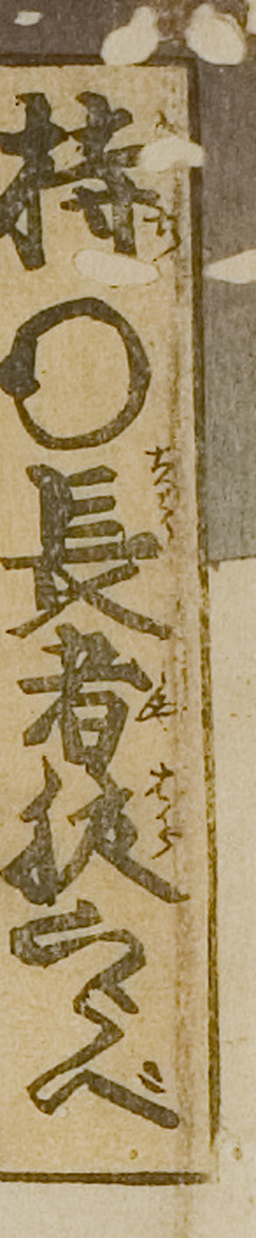持○長者腹くらべ
